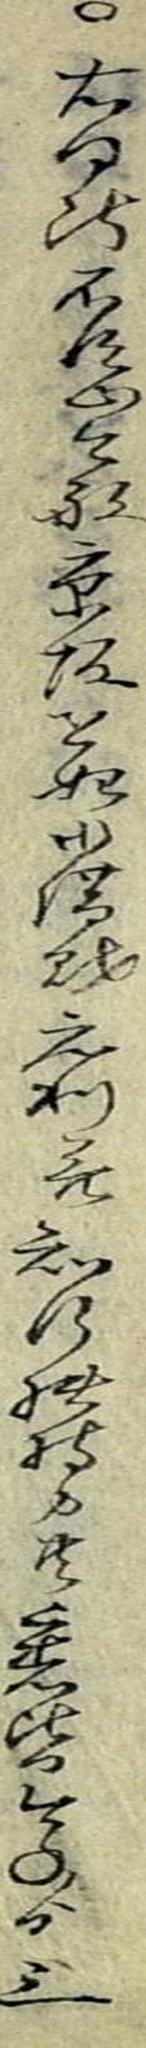○同断不得止今般京坂を始御借財元利并知行扶持方共悉皆今年ゟ三
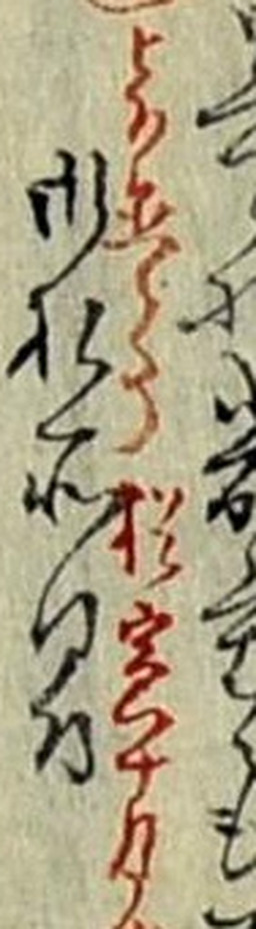御札所目付
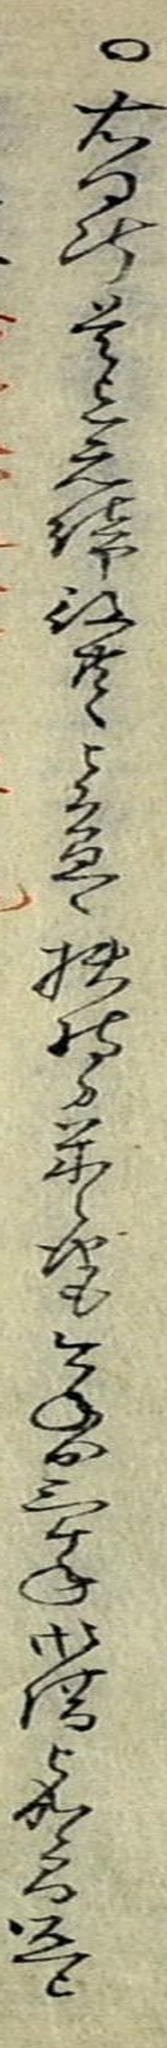○右同断是迄元締役共へ被下置候扶持方米之儀も今年ゟ三ヶ年御借被成候間宜被
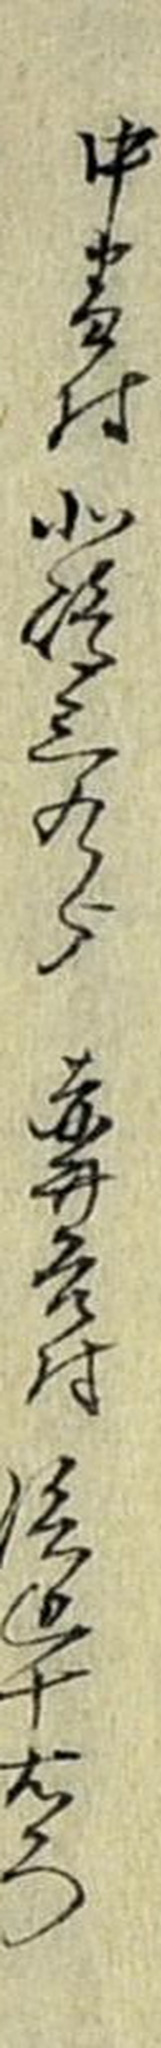中番村北嶋三九郎赤井谷村渡辺十右衛門
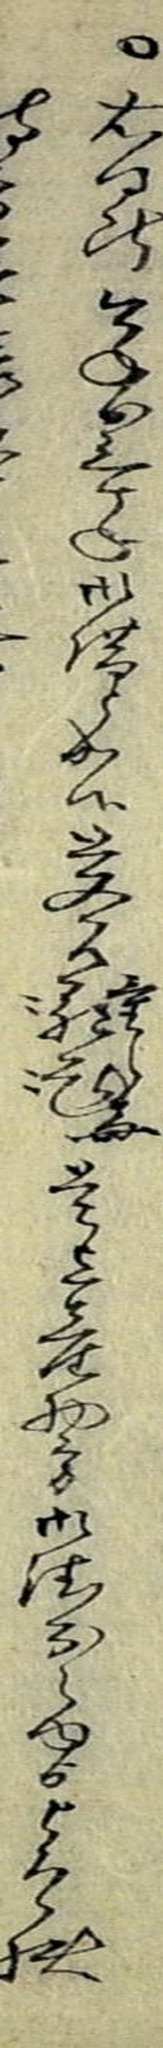○右同断今年ゟ三ヶ年御借被成候且又乍難題年毎是迄産物方御徳分之内ゟ被下候扶
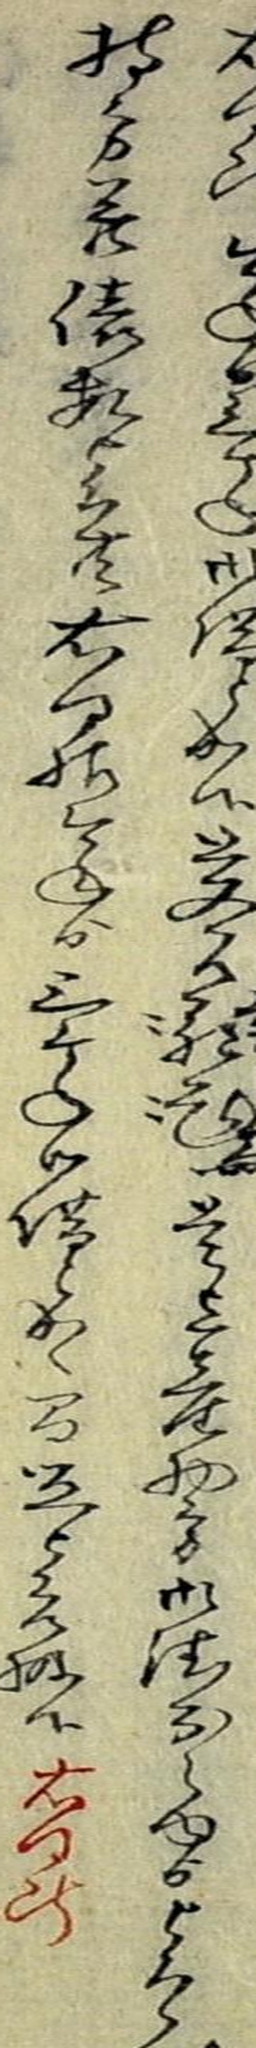持方并俵数被下共右同様今年ゟ三ヶ年御借被成候間宜被取扱候右同断
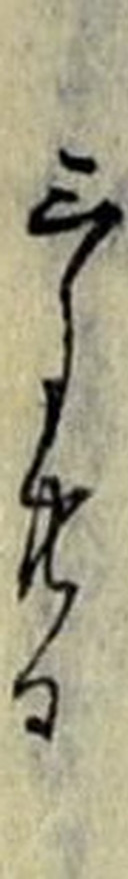三月廿日
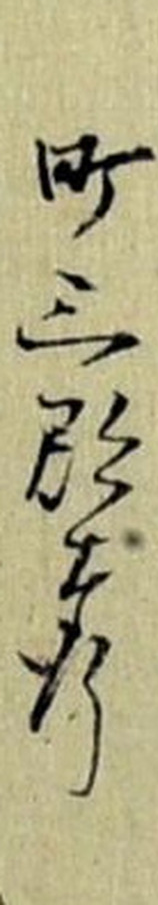町三郡奉行
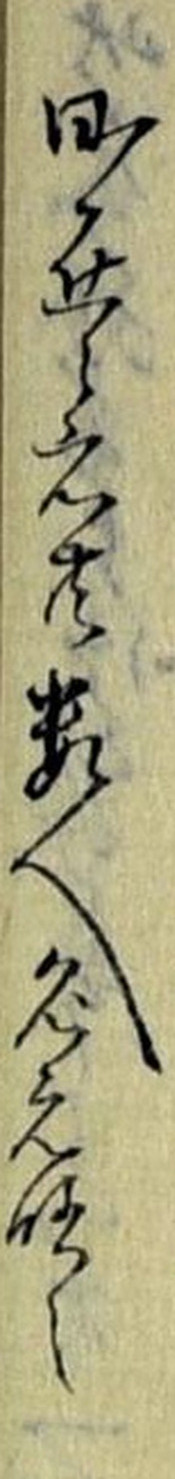町在之者共数人名元略之
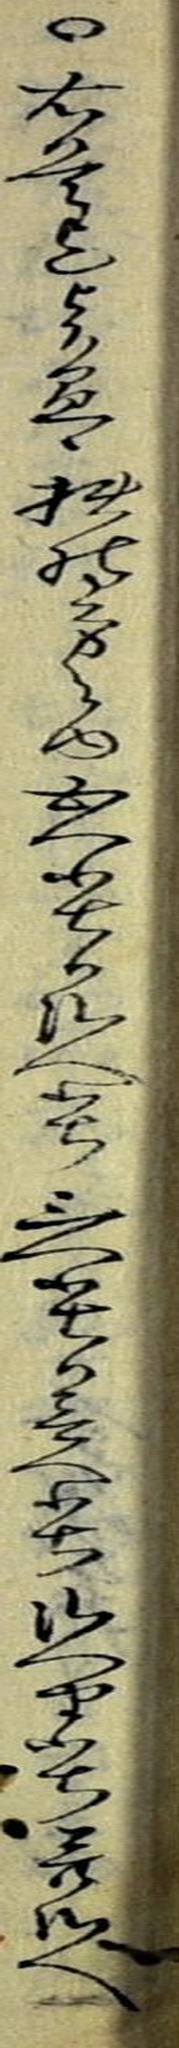○右是迄被下置候扶持方之内五人ふちは弐人ふち三人ふちは壱人ふち弐人半ふち并弐人
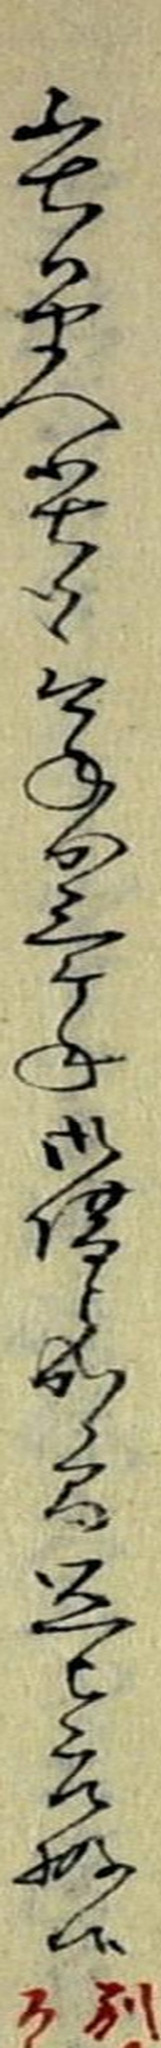ふちは半人ふちつヽ今年ゟ三ヶ年御借被成候間宜被取扱候
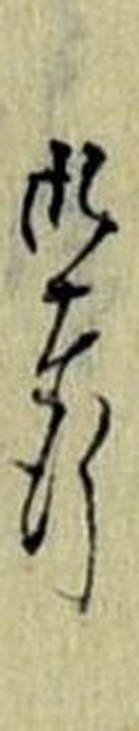御奉行
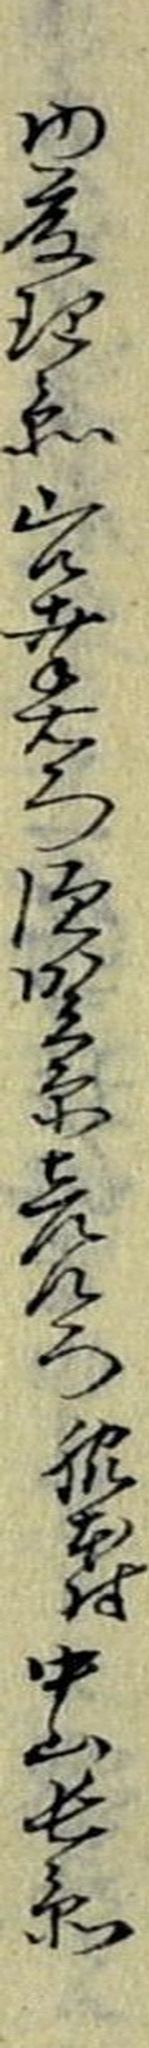内藤理兵衛山口幸右衛門須賀原彦左衛門脇本村中山長兵衛
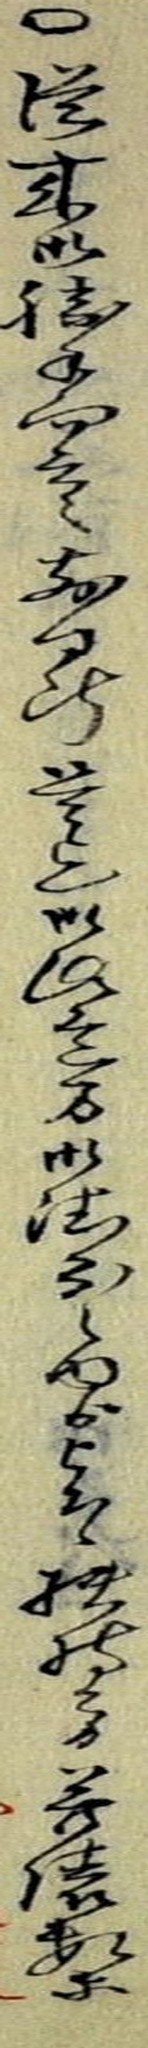○従來御勝手向云々前同断是迄御趣意方御徳分之内ゟ被下候扶持方并俵数等
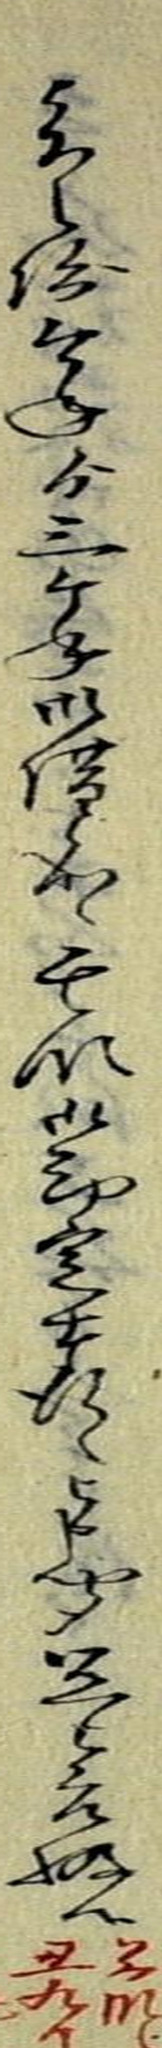被下候儀今年ゟ三ケ年御借被成候其段御勘定奉行へ申聞宜被取扱候
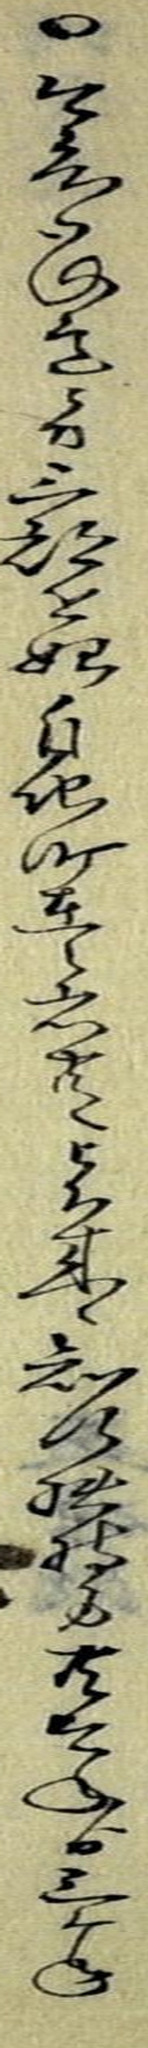○今度御趣意に付三都を始自他町在之者共へ被下来候知行扶持方共今年ゟ三ヶ年
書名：命令之部 六
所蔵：福井県文書館 Fukui Prefectural Archives
